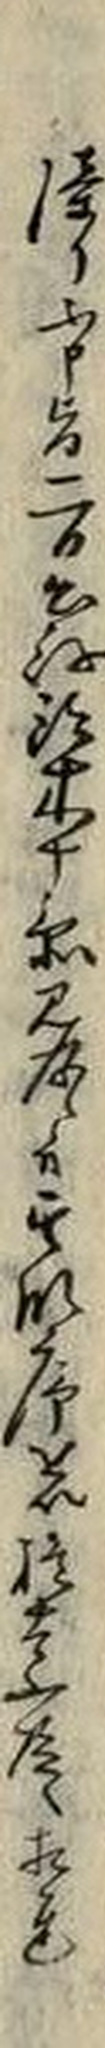障り不申旨二日出役鈴木十兵衛見及候に付其段序を以権大夫殿へ相達御徒目付
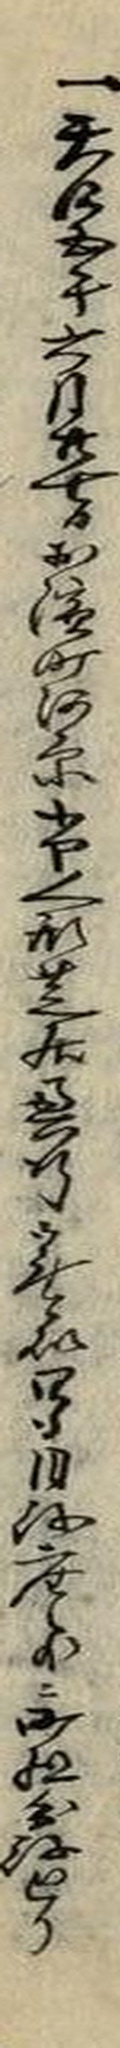一天保五午六月廿七日於浜町河原小や人形芝居興行御座候処四ツ目役座之外に町組分役廻り
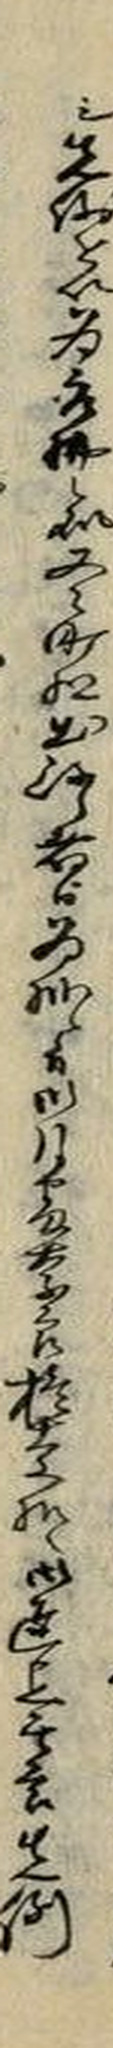シ先例を以為取払候処又々町組出役之者ゟ為掛候に付御月番奈良権大夫様へ御達申上其節先例
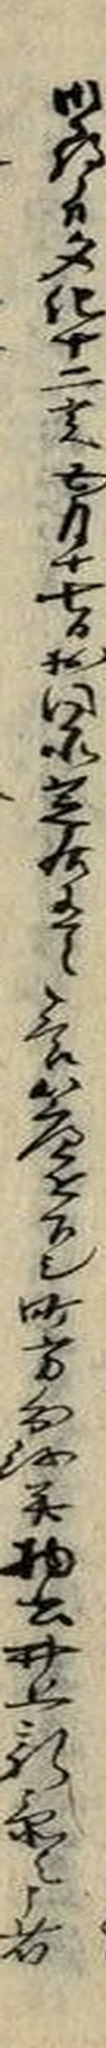御尋に付文化十二亥五月十七日於同所芝居有之候節簾を下シ町方分役并物書井上新兵衛と申者
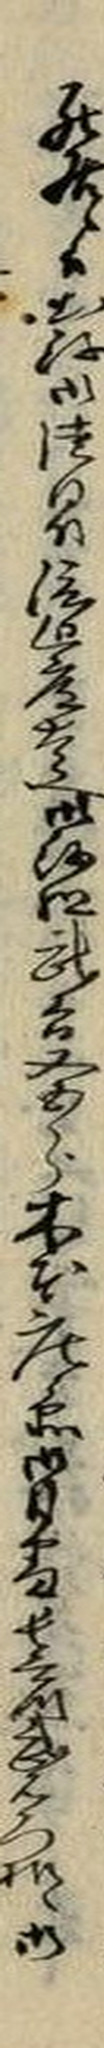罷居候付出役御徒目付渡辺藤大夫御役組武谷又五郎木本庄兵衛御月番長谷川武右衛門様へ御
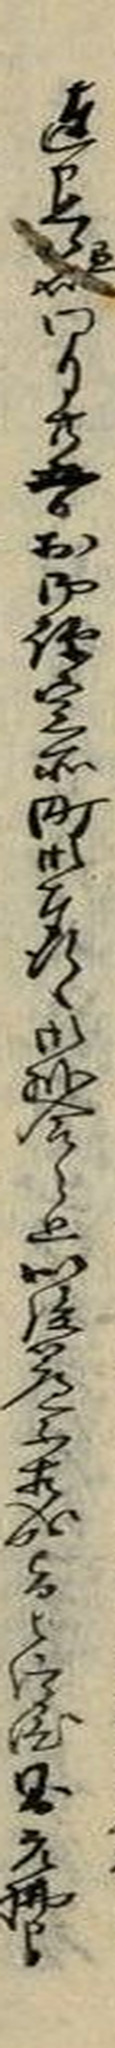達申上置候処同月廿五日於御評定所町御奉行へ御掛合之上以後簾不相成旨被仰渡則取払申
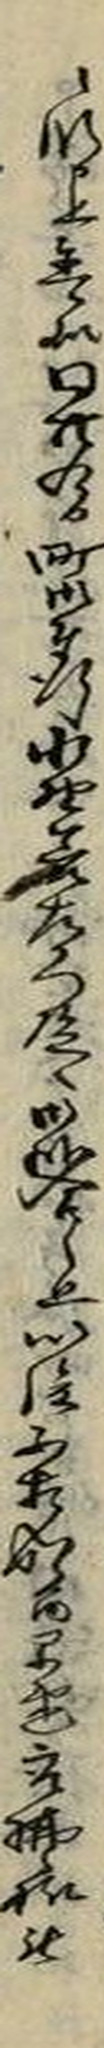之段申上置候処同廿九日町御奉行水野善左衛門殿へ御掛合之上以後不相成候間早速取払候様被
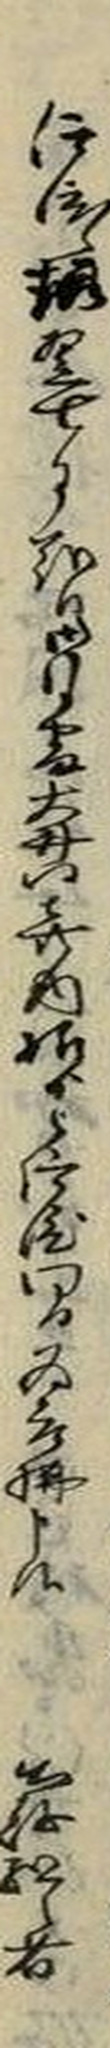仰渡候趣翌七月朔日御月番大井田喜内様ゟ被仰渡同日為取払申候出役組之者
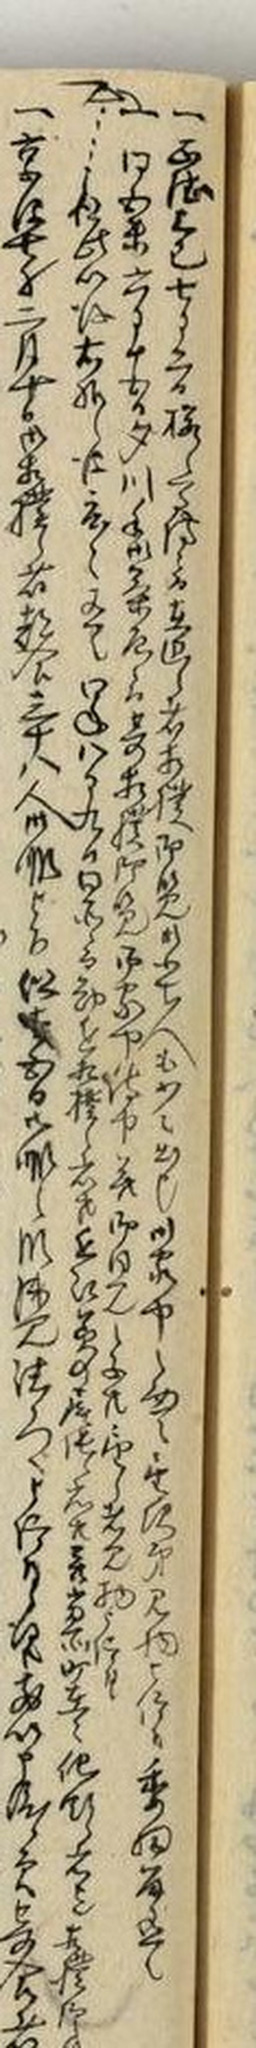一同五未六月十五日夕川手御茶屋にて寄相撲御覧御家中侍中并御目見之子共望之者見物被仰付候
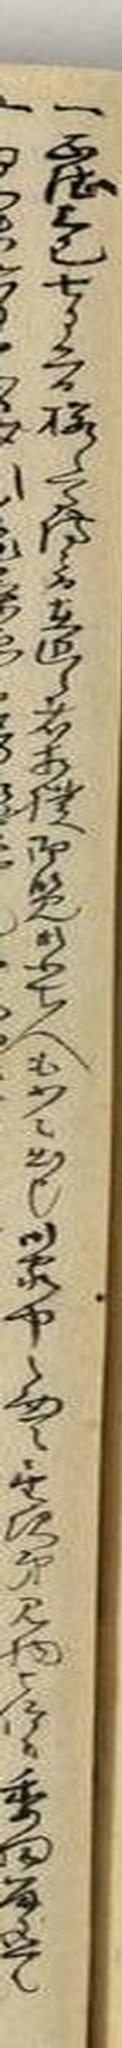一正徳三巳七月二日桜之馬場にて在辺之者相撲御覧御ふち人も少々出申候御家中之面々望次第見物被仰付委細留有之
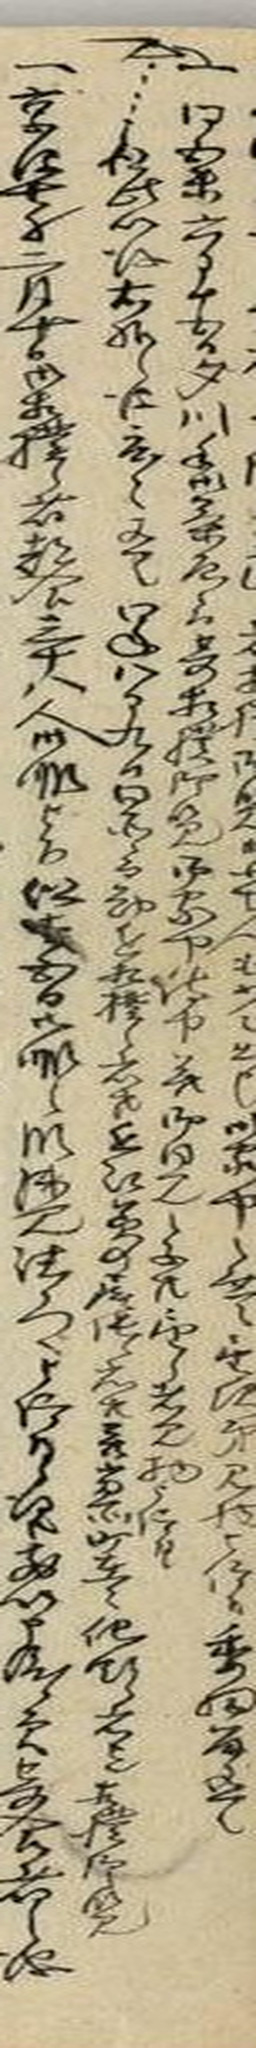一享保七刁二月十日御相撲之者都合三十八人御暇被下但五日御暇之段浅見徳右衛門へ被仰付候得共前以申渡候ては寄合者之儀
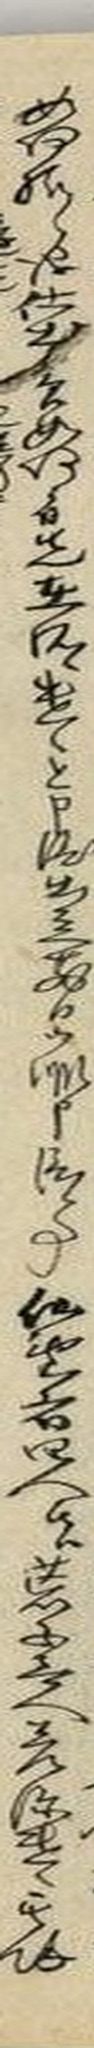如何様之儀仕出ては如何に付先在所へ遣候と申渡出立前日御暇申渡候事仙台者四人えは荒子壱人差添遣候其余
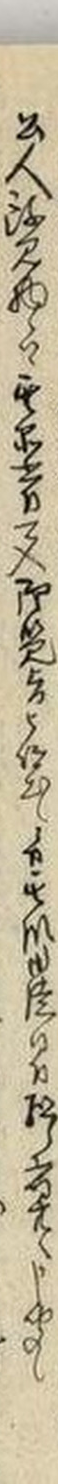公人致見物候はゝ其品書付可入御覧旨被仰出候に付其段御徒目付組之者共へ申聞候
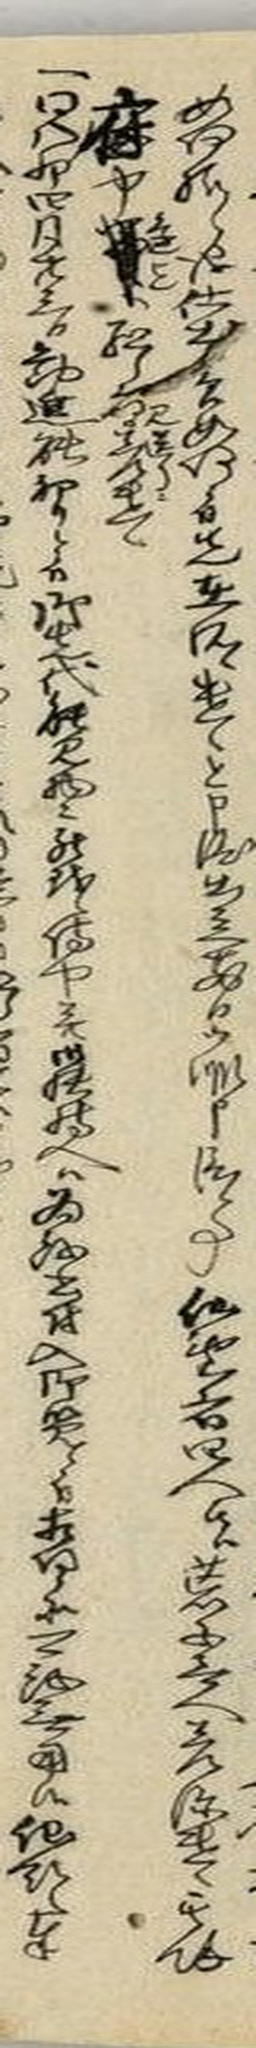一同八卯四月廿三日勧進能初り候に付御先代能見物に罷越候侍中并御扶持人為致書付入御覧候に付相伺候処可致無用候他領之奉
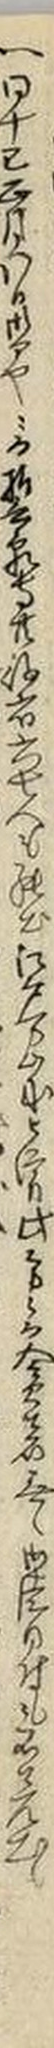一同十巳正月八日御部やにて誓願寺共役者六七人も罷出江戸万歳被仰付此方にて貪着無之御徒目付も不差出候
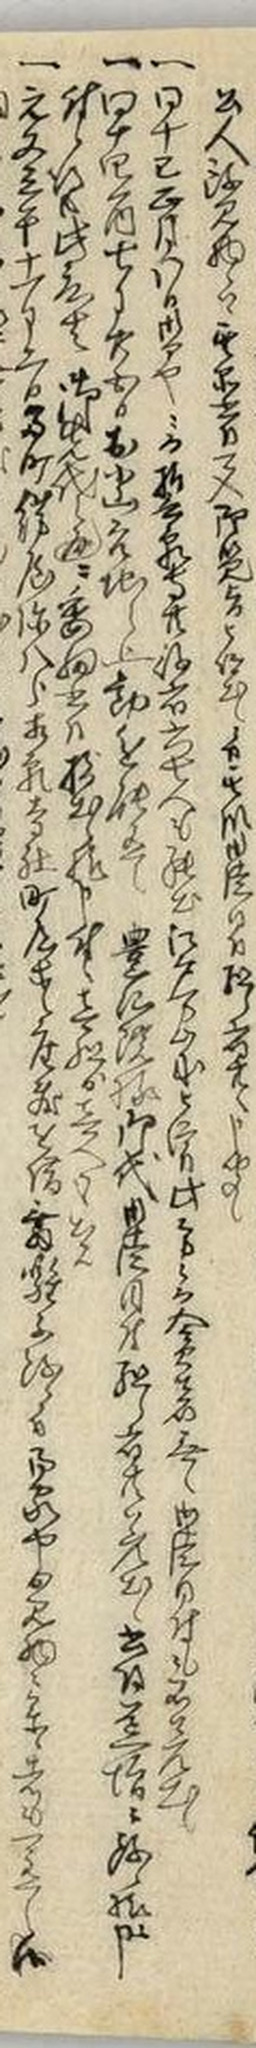一同十四酉七月廿五日於小山谷地之上勧進能有之豊仙院様御代御徒目付組之者共差出候書付荒増に致候様に申
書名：御城下諸事之部
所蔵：福井県文書館 Fukui Prefectural Archives
